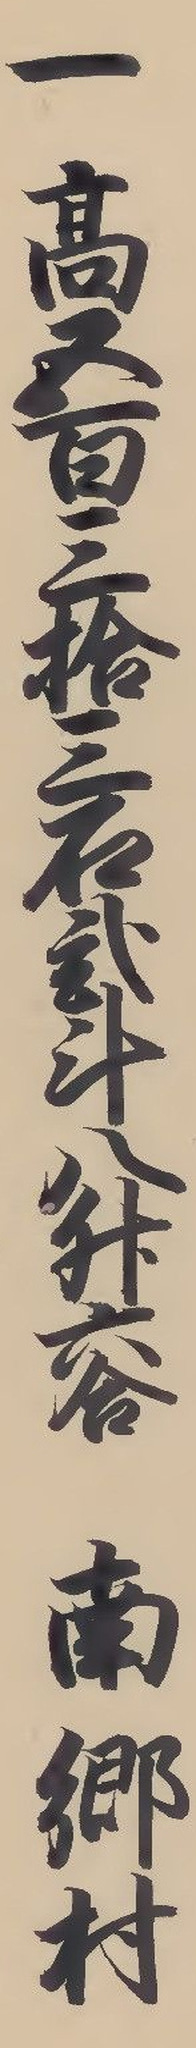一高五百三拾三石弐斗八升六合南郷村

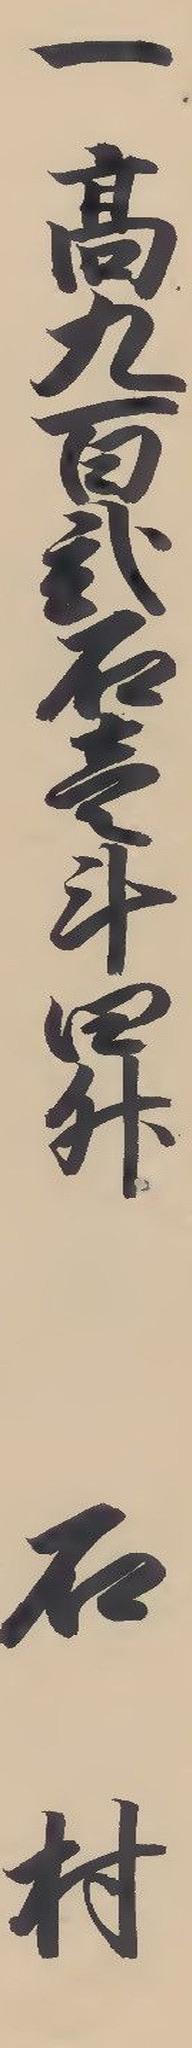一高九百弐石壱斗四升石村
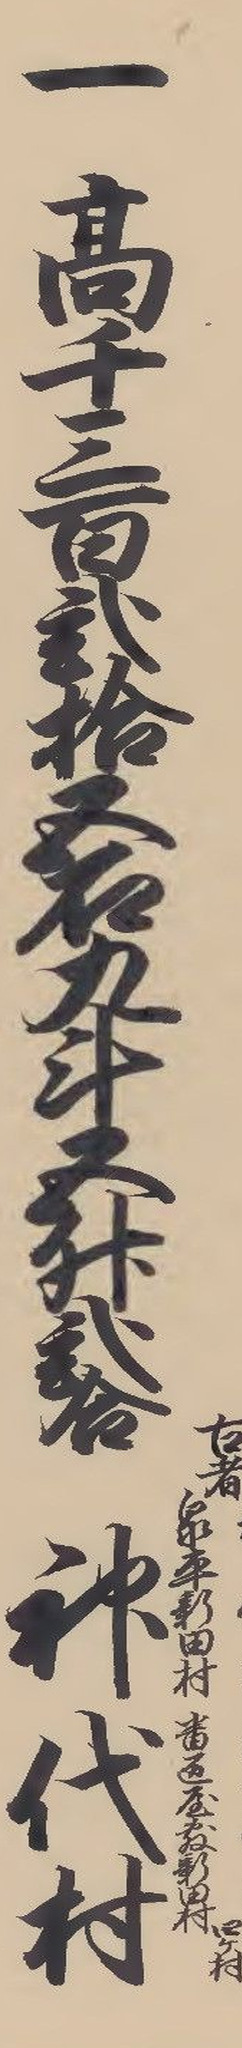一高千三百弐拾五石九斗五升弐合神代村
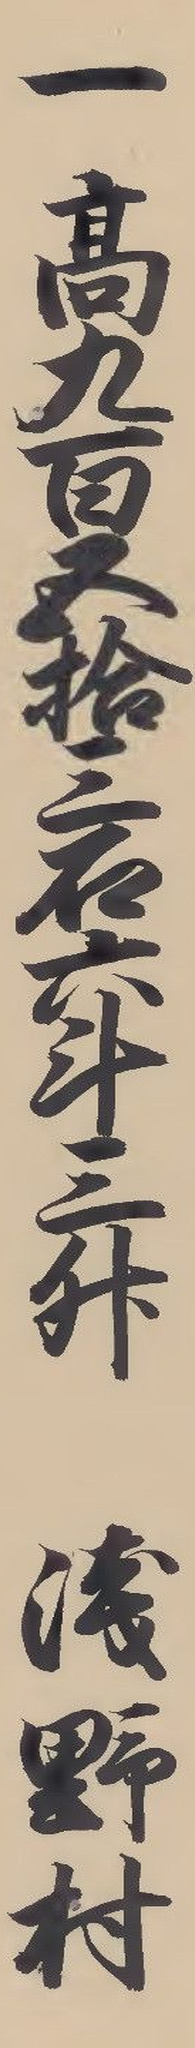一高九百五拾三石六斗三升浅野村
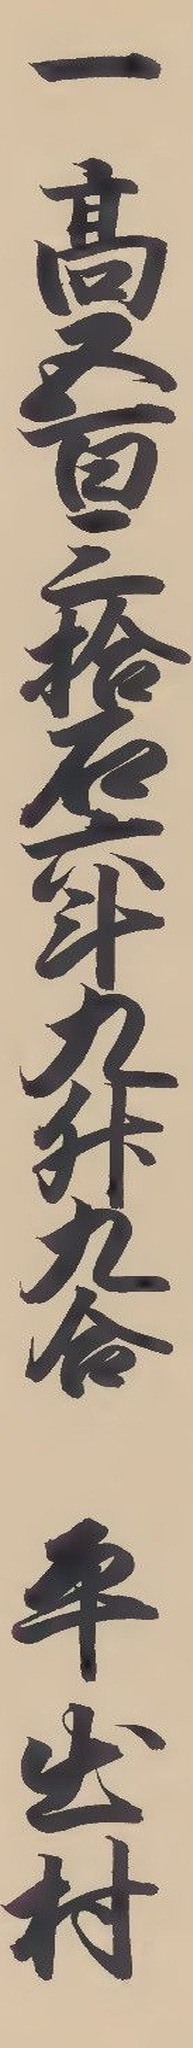一高五百三拾石六斗九升九合平出村
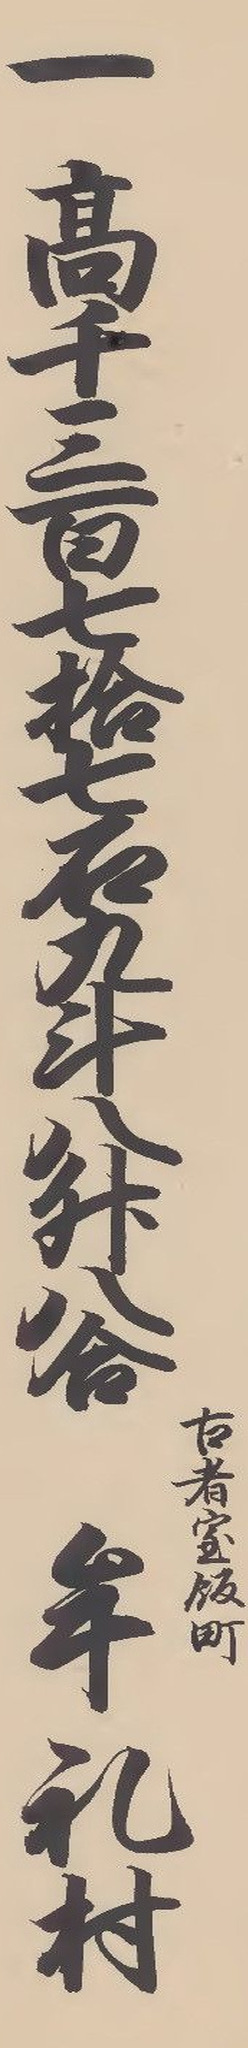一高千三百七拾七石九斗八升八合牟礼村
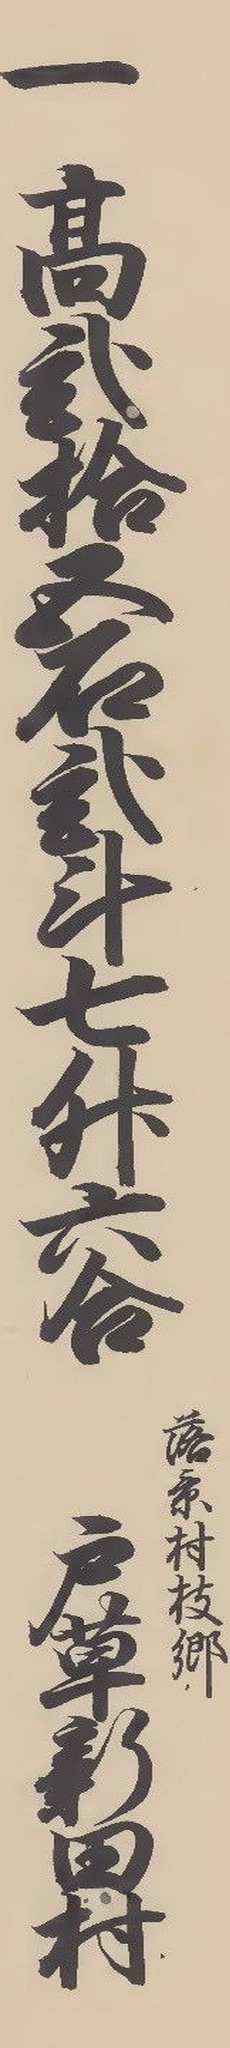一高弐拾五石弐斗七升六合戸草新田村
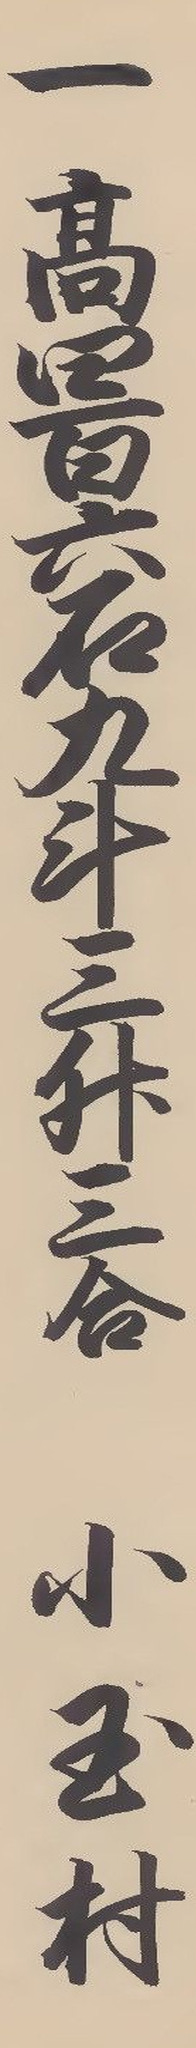一高四百六石九斗三升三合小玉村
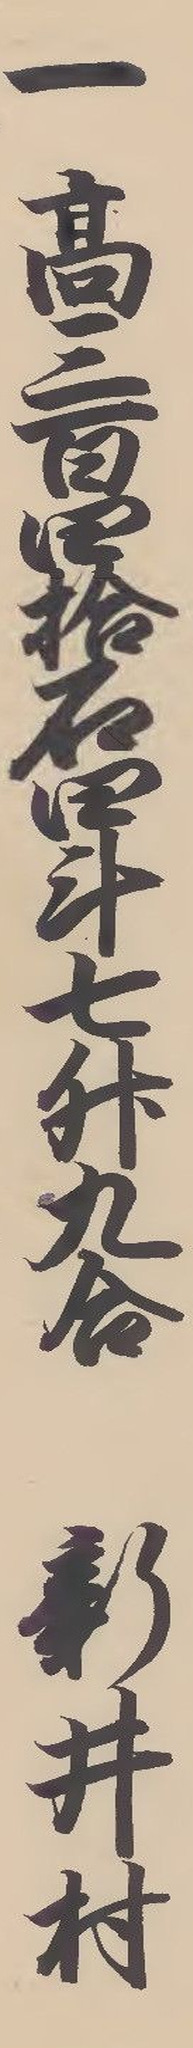一高三百四拾石四斗七升九合新井村

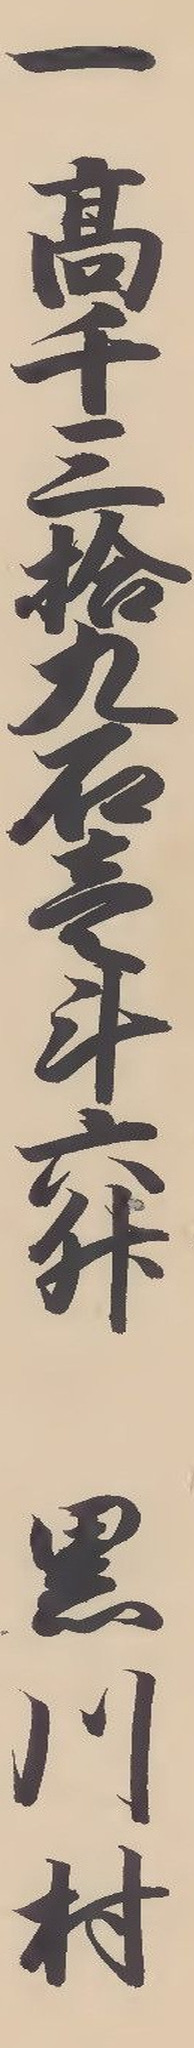一高千三拾九石壱斗六升黒川村
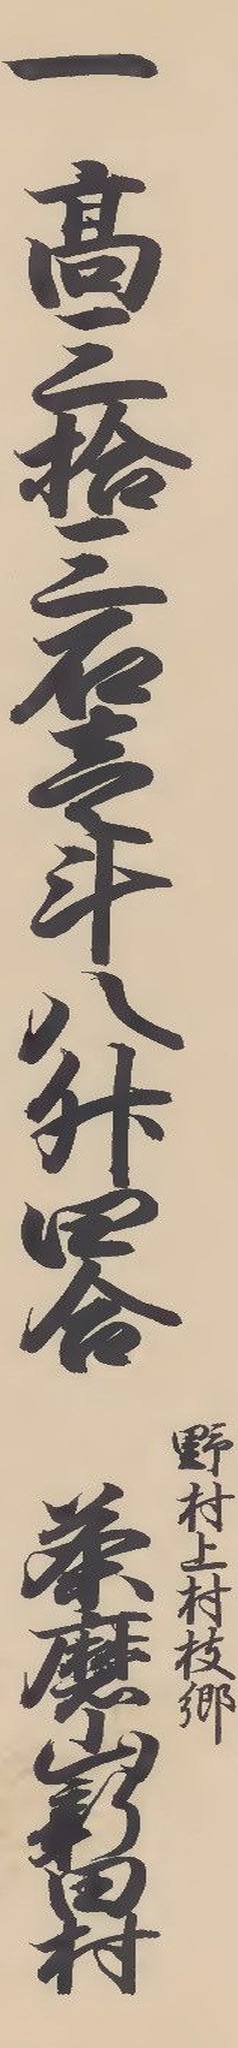一高三拾三石壱斗八升四合茶磨山新田村
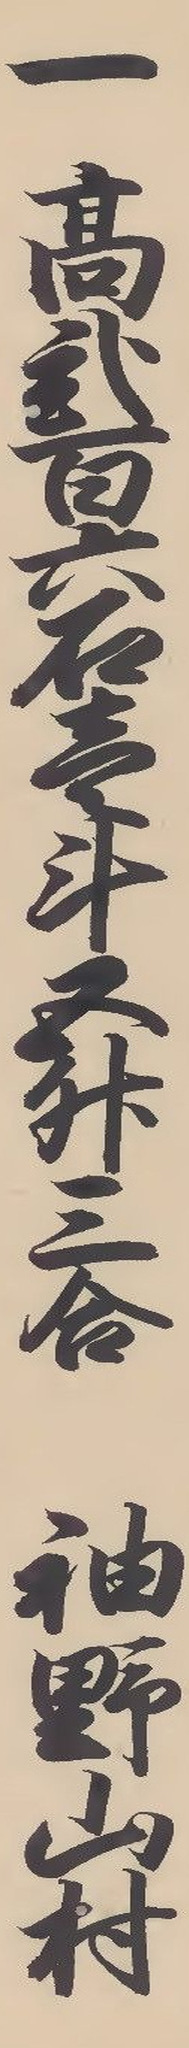一高弐百六石壱斗五升三合袖野山村
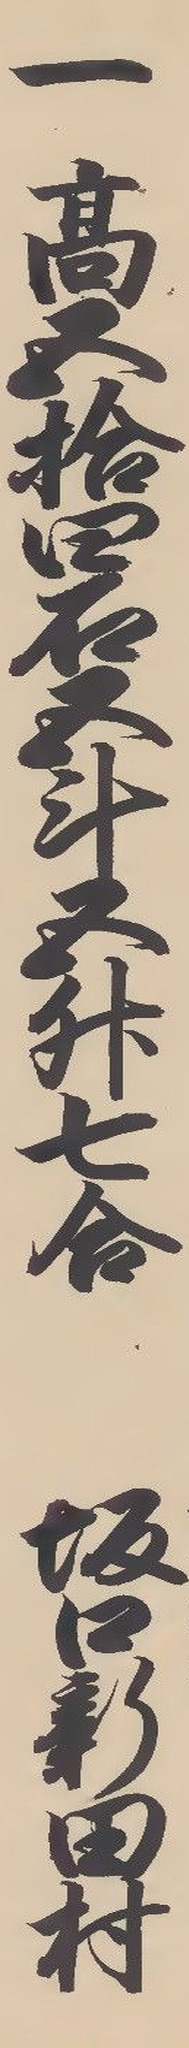一高五拾四石五斗五升七合坂口新田村
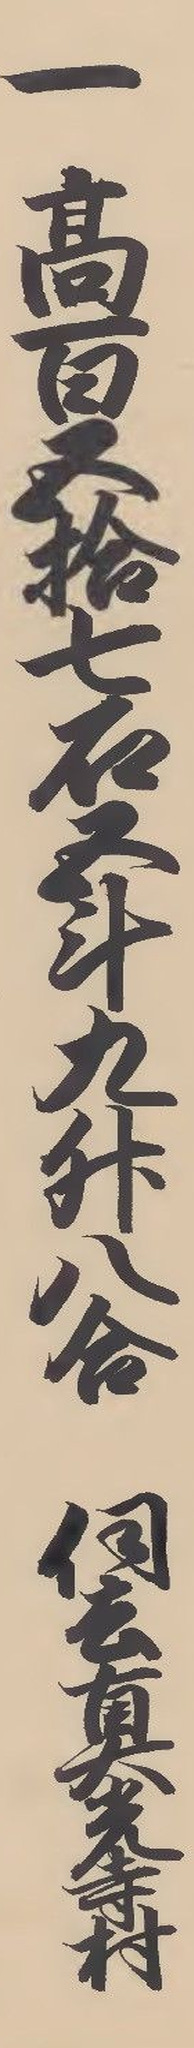一高百五拾七石五斗九升八合伺去真光寺村
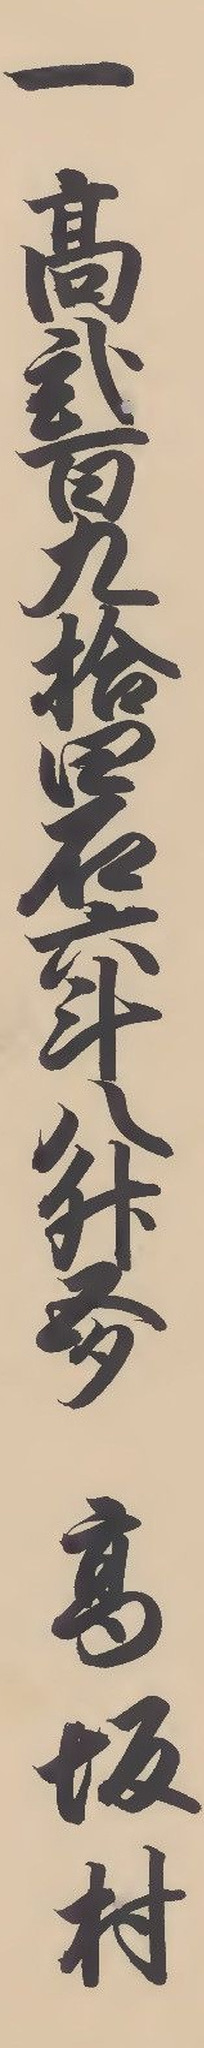一高弐百九拾四石六斗八升五勺高坂村
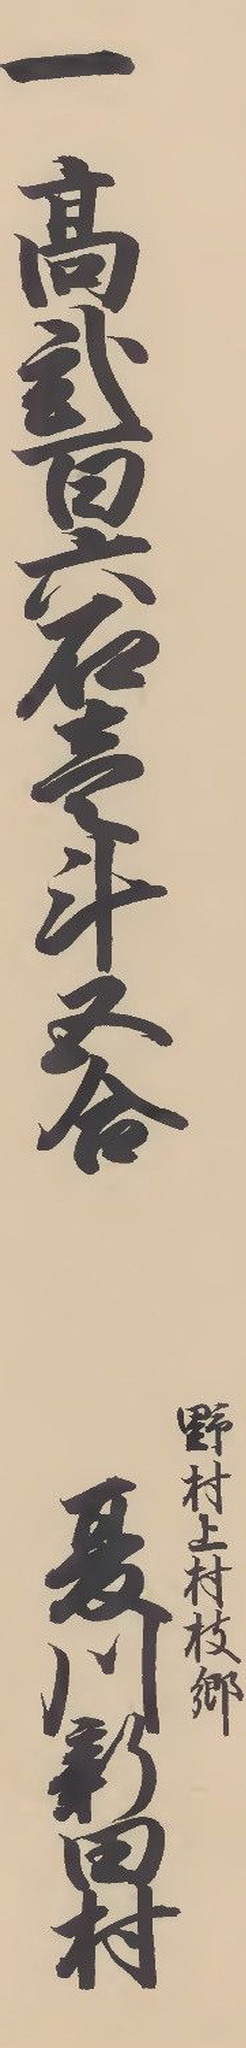一高弐百六石壱斗五合夏川新田村
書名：信濃国郷帳
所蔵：国立公文書館 National Archives of Japan
